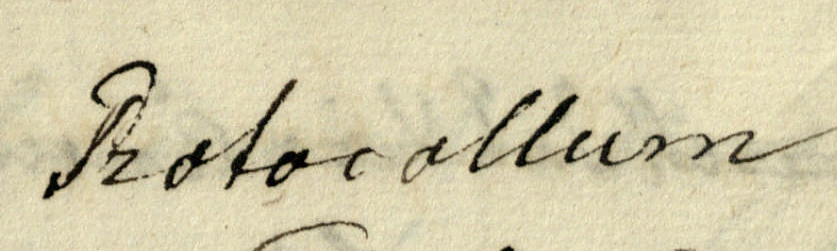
Protocollum
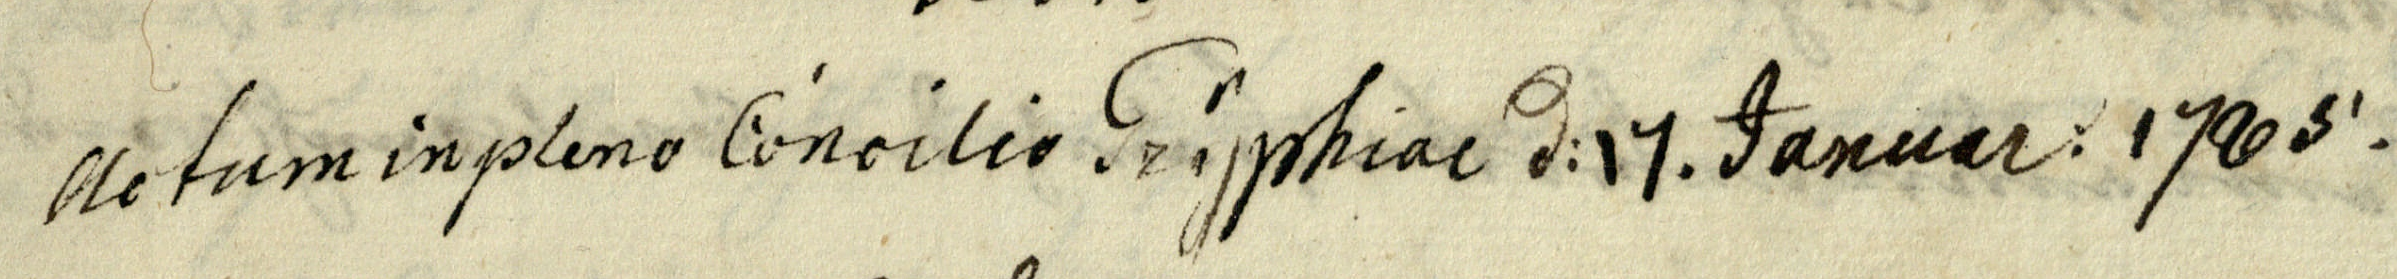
Actum in pleno Concilio Grÿphiae d: 17. Januar 1785.
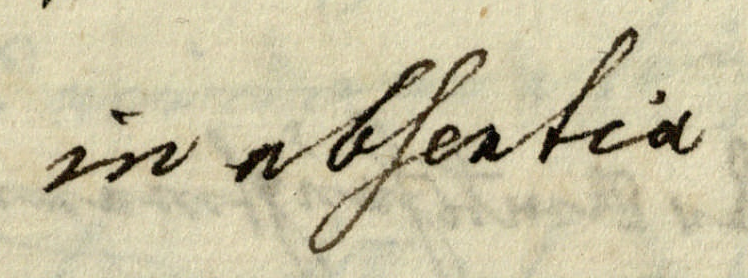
in absentia
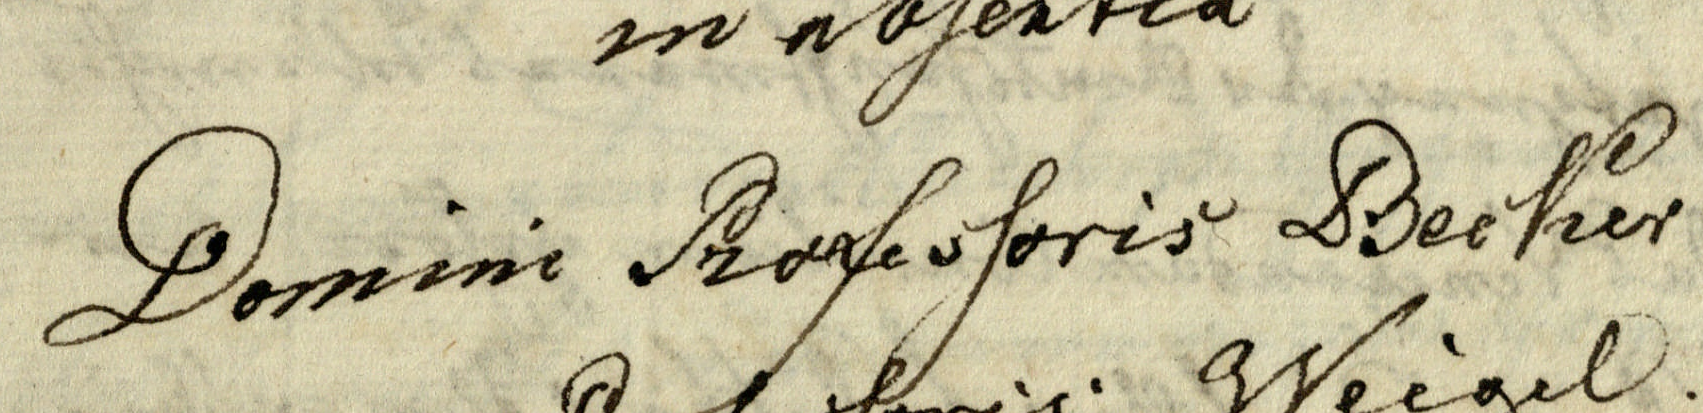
Domini Professoris Becker.
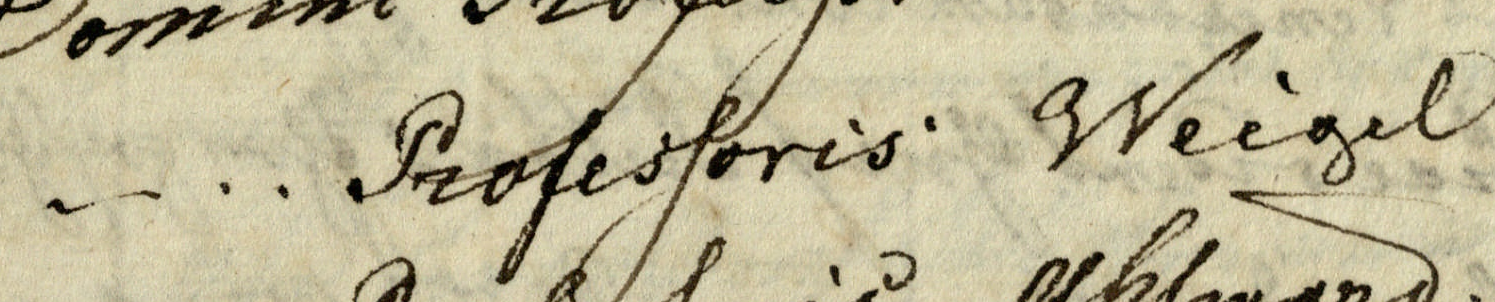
Professoris Weigel.
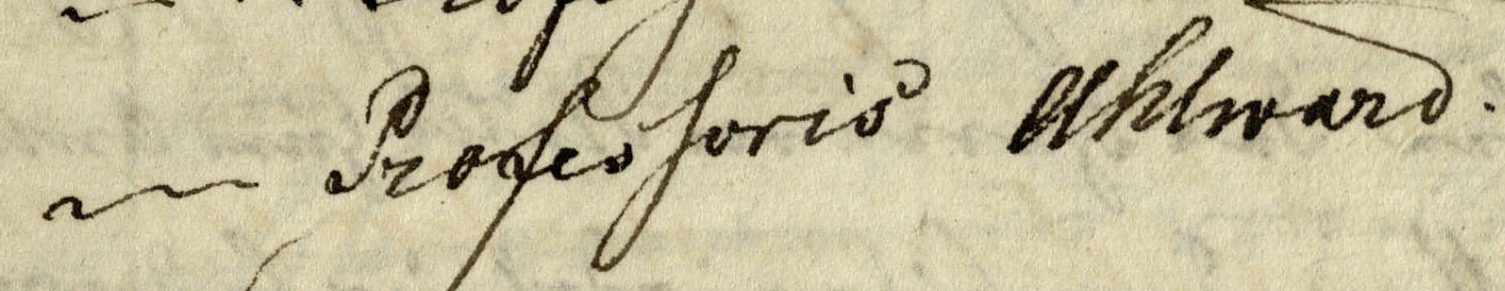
Professoris Ahlward.
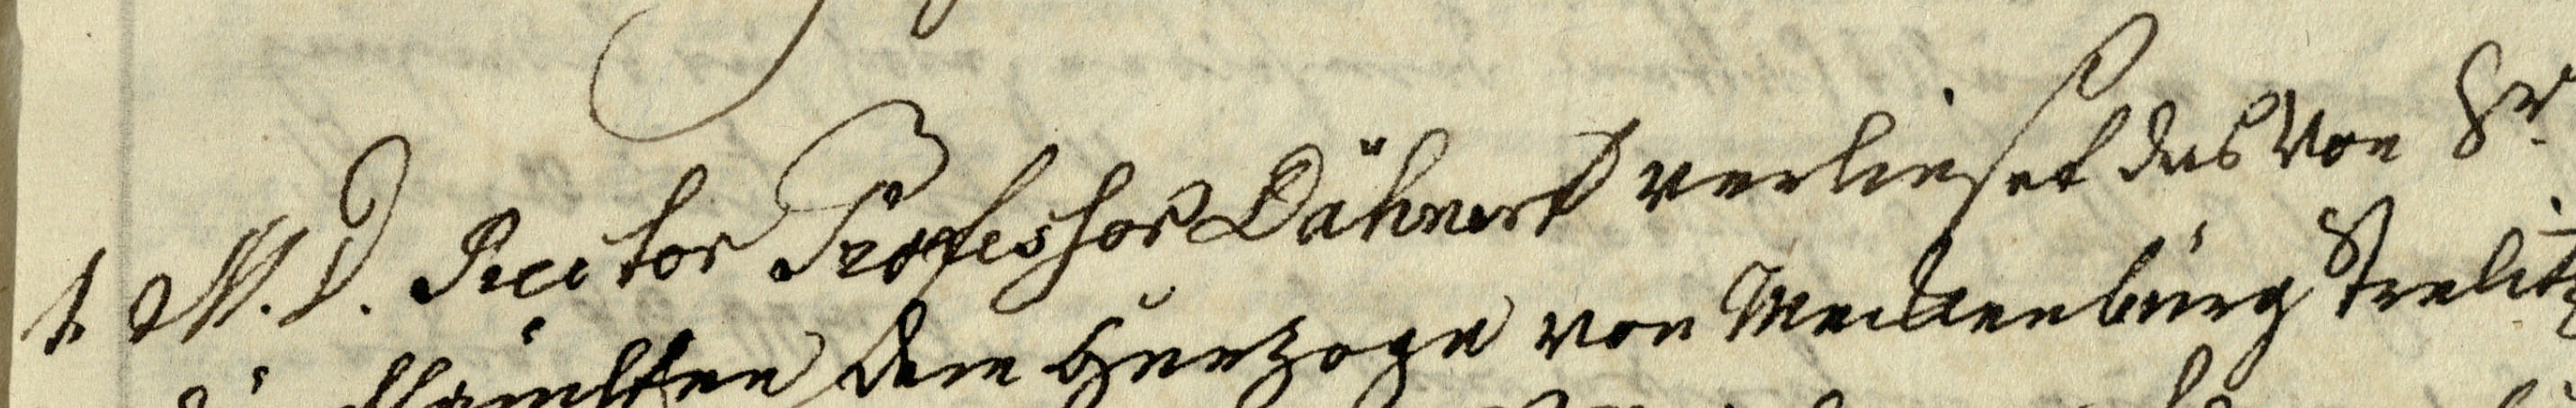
1. M. D. Rector Professor Dähnert verlieset das von Sr.
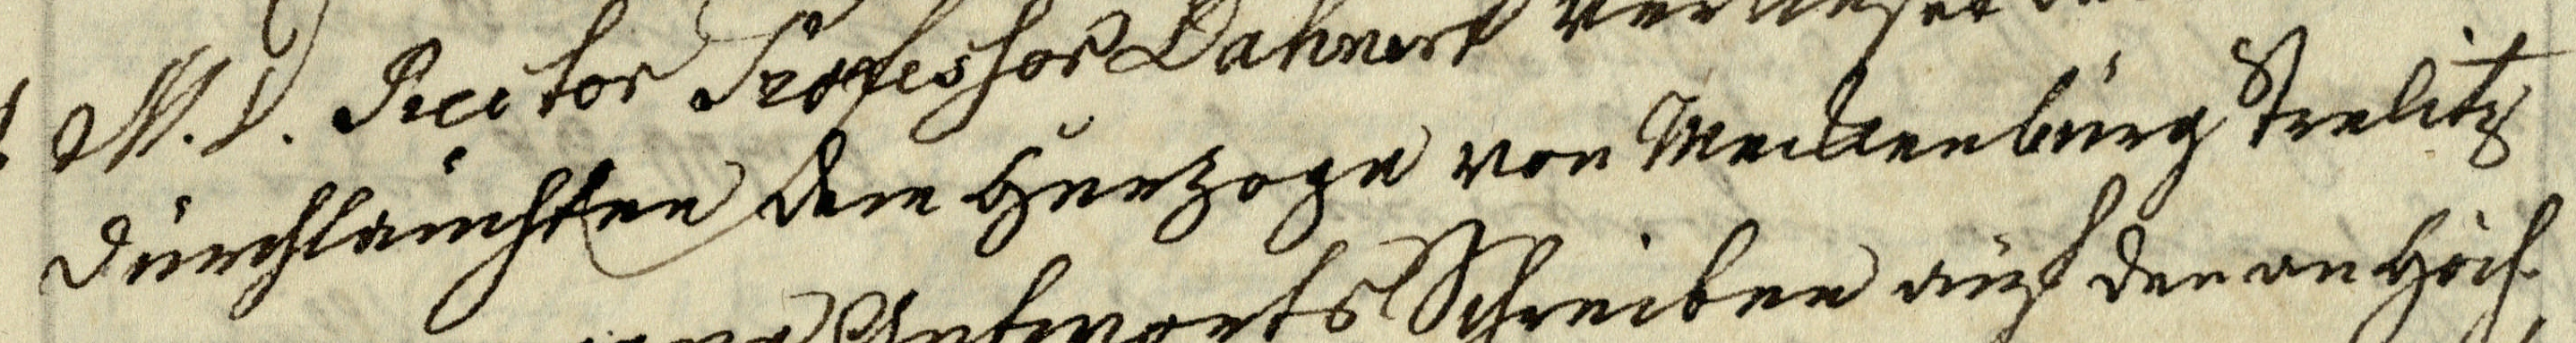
Durchlauchten dem Herzoge von Mecklenburg Strelitz
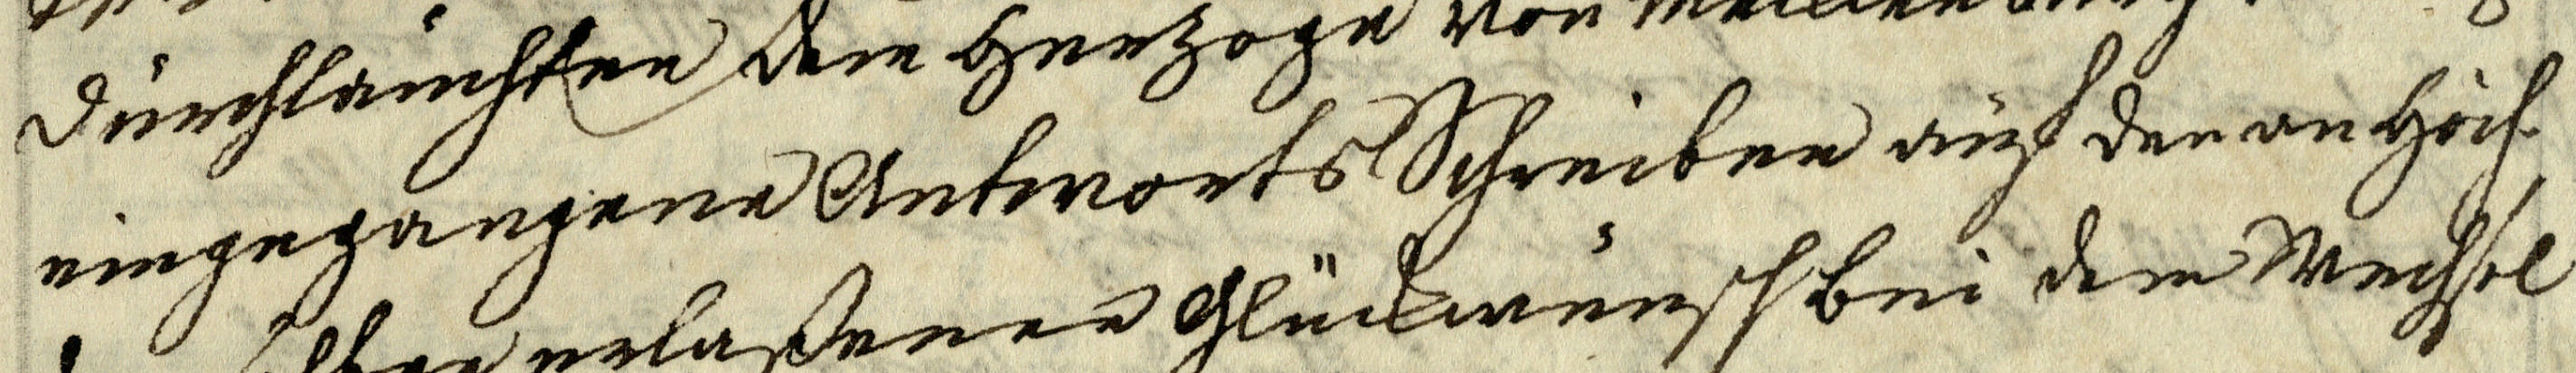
eingegangene Antworts Schreiben auf den an Hoch¬
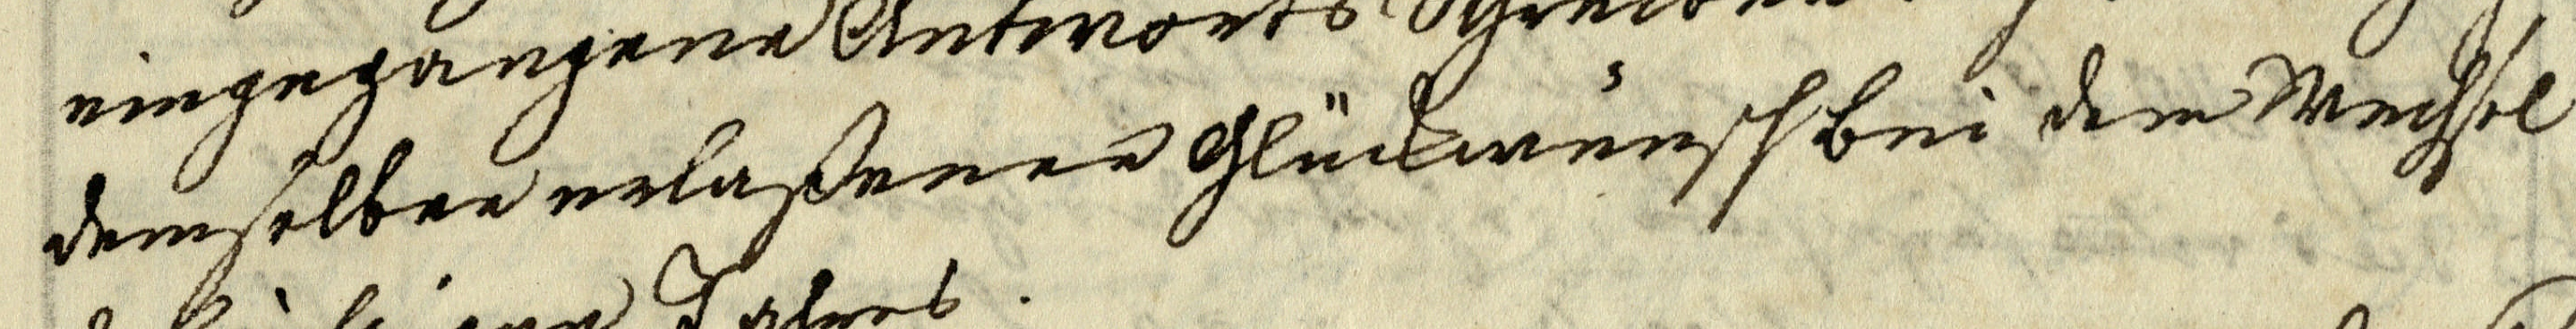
demselben erlaßenen Glückwunsch bei dem Wechsel
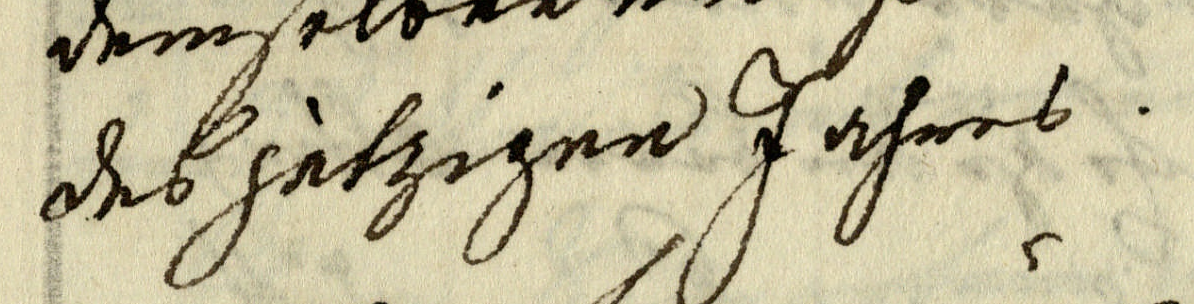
des jetzigen Jahres.
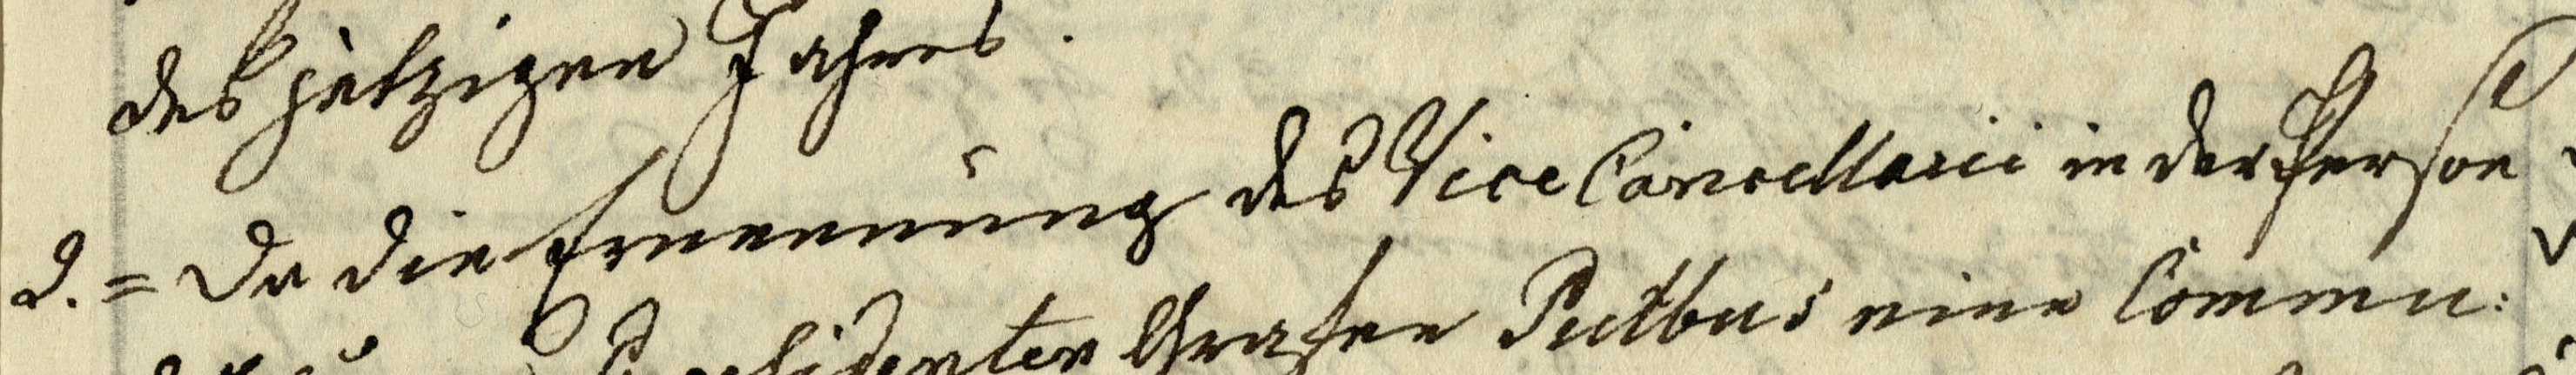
2. Da die Ernennung des ViceCancellarii in der Person
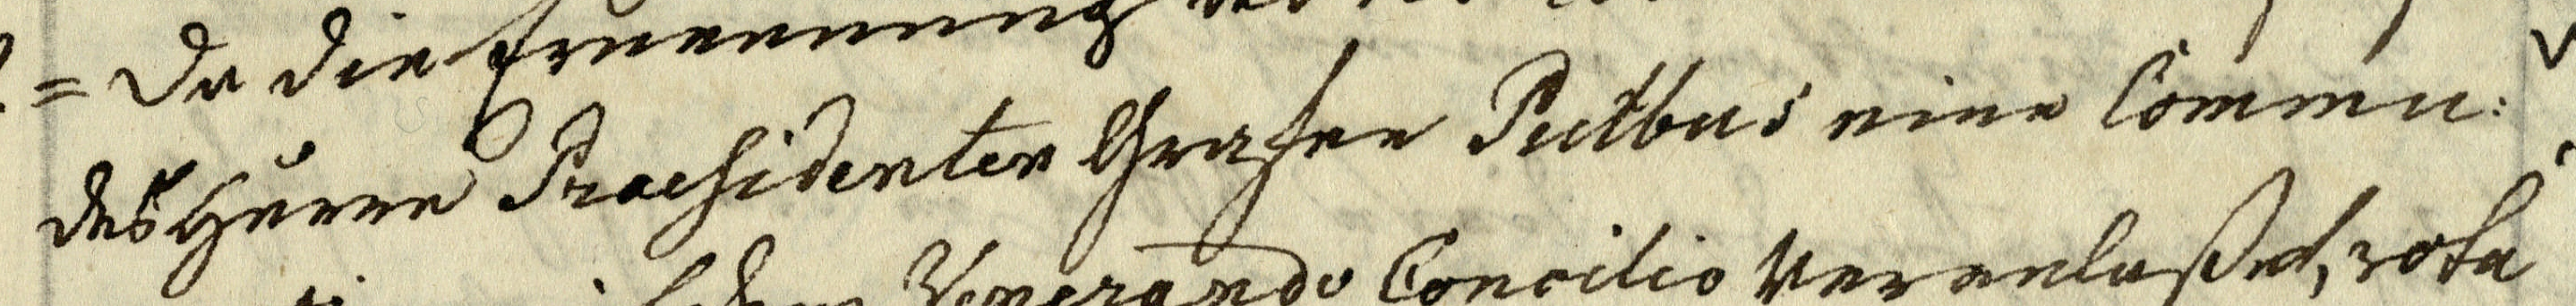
des Herrn Praesidenten Grafen Putbus eine Commu¬
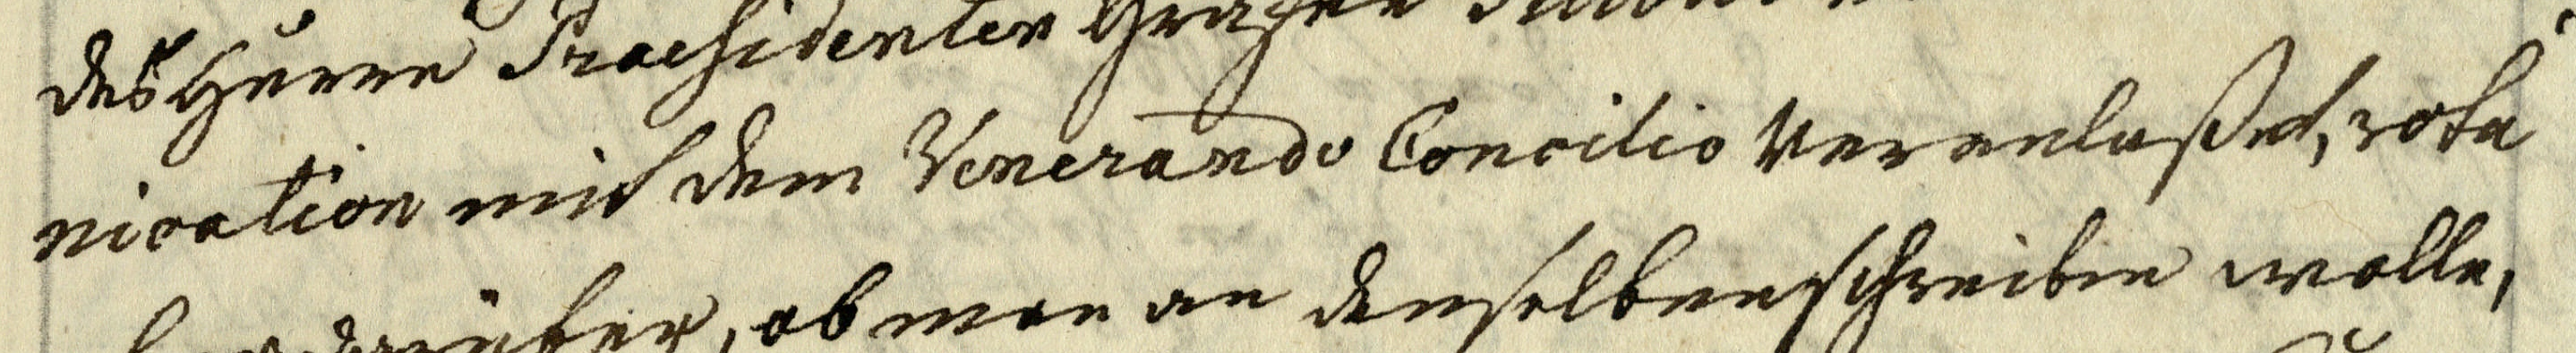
nication mit dem Venerando Concilio veranlasset, vota
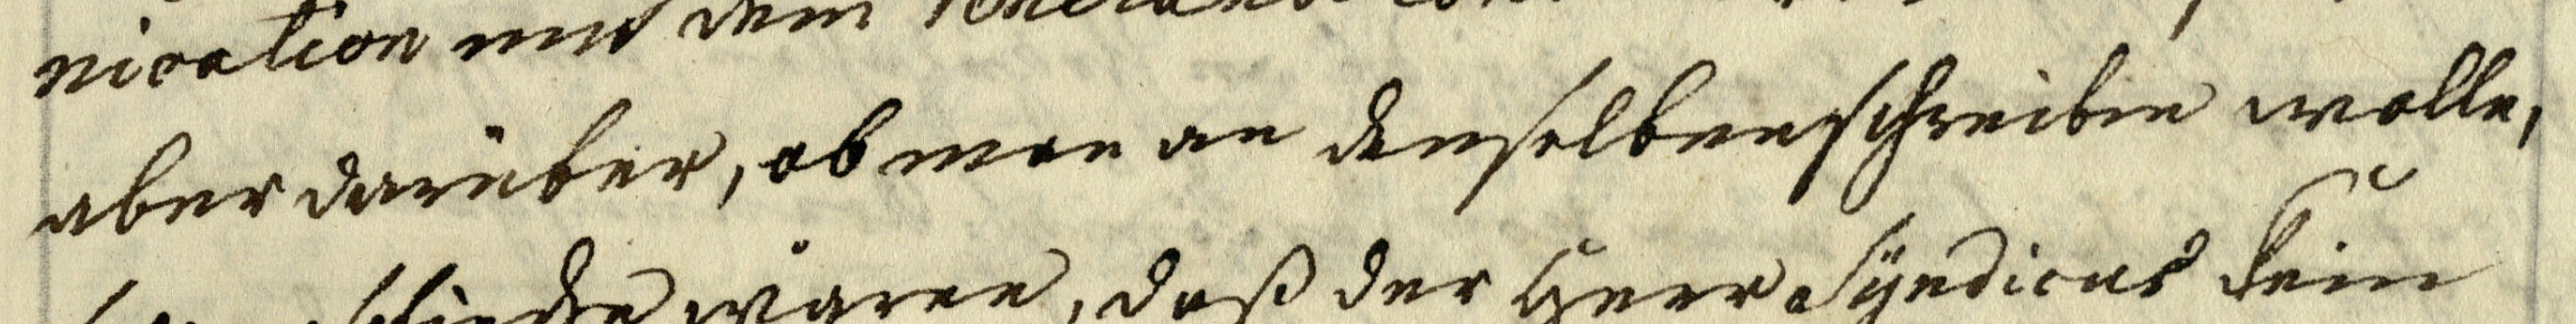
aber darüber, ob man an denselbenschreiben wolle,
